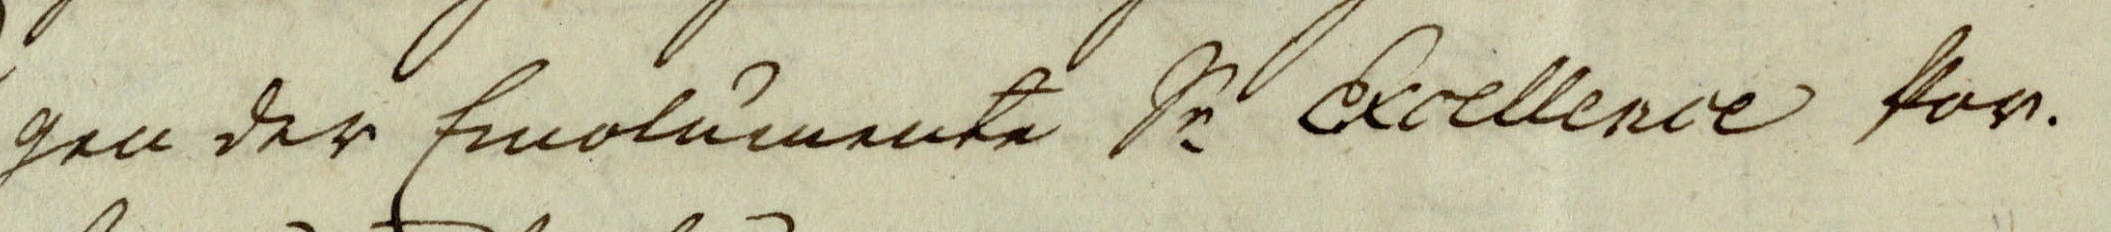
gen der Emolumente Sr. Excellence Vor¬
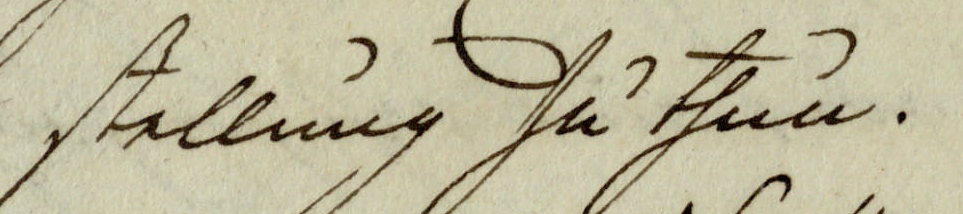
stellung zu thun.
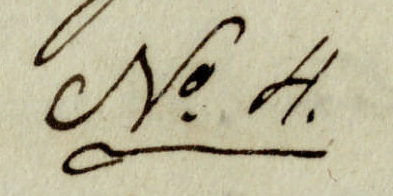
No 4.
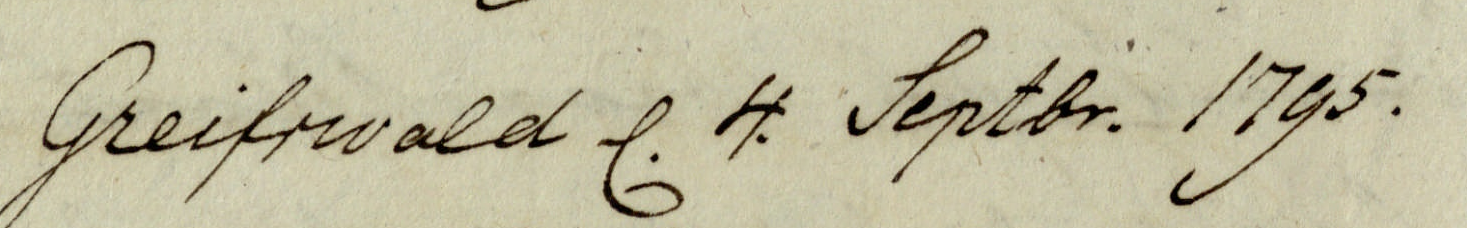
Greifswald d. 4. Septbr. 1795.
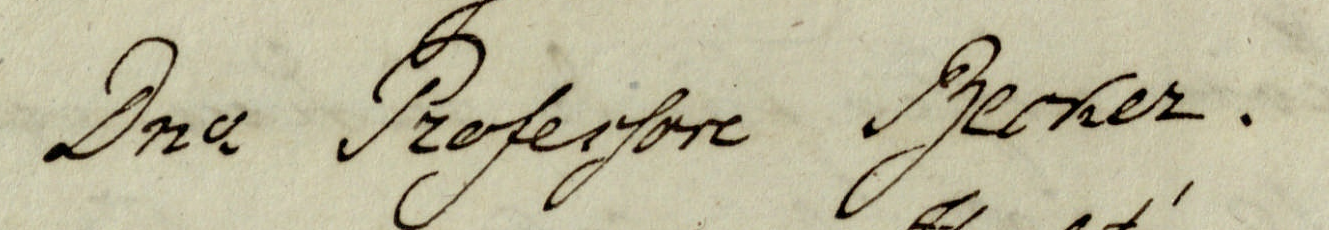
Dno Professore Becher.
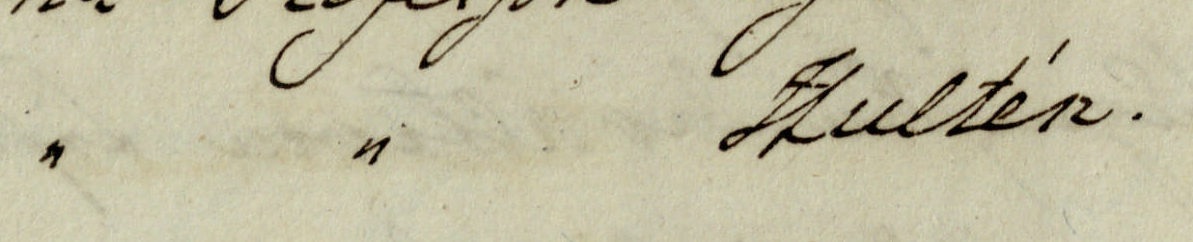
" " Hulten.
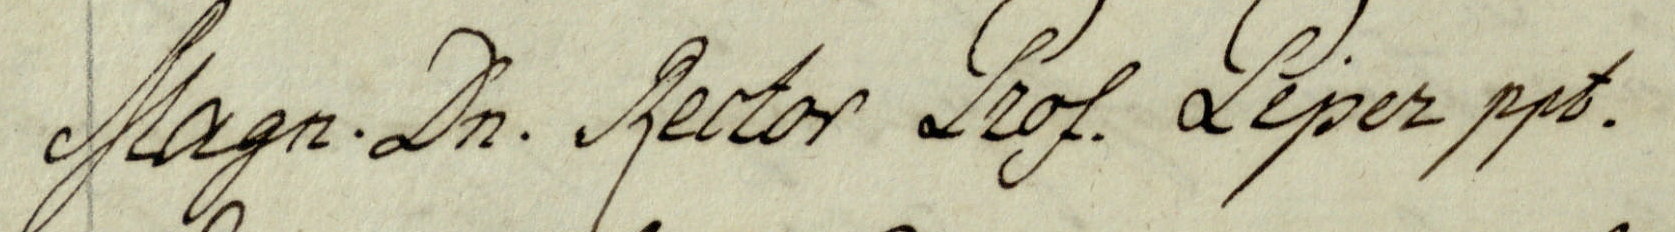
Magn. Dn. Rector Prof. Piper ppt.
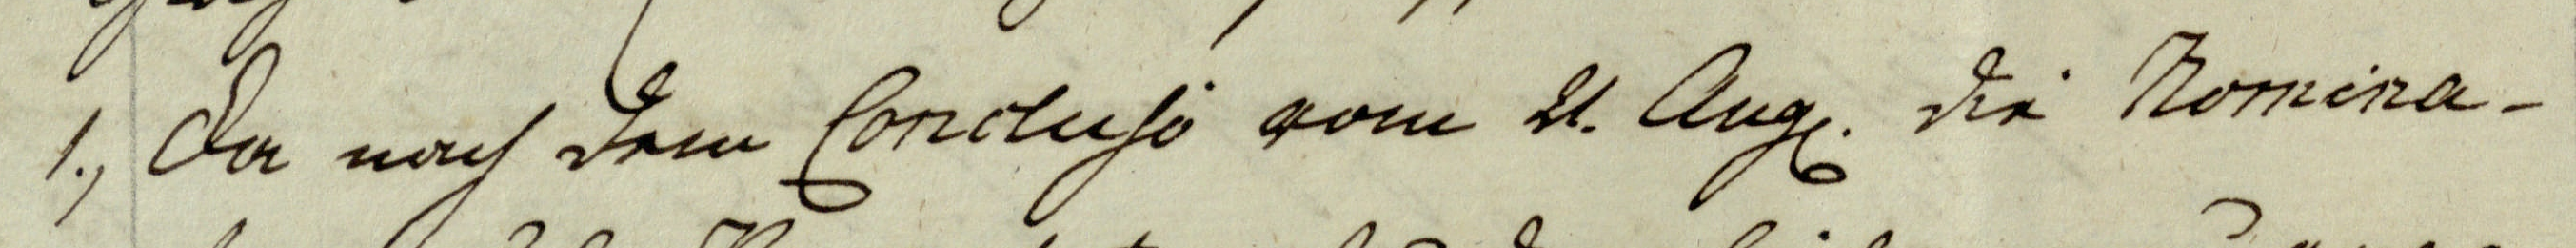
1., Da nach dem Concluso vom 21. Aug. die Nomina¬
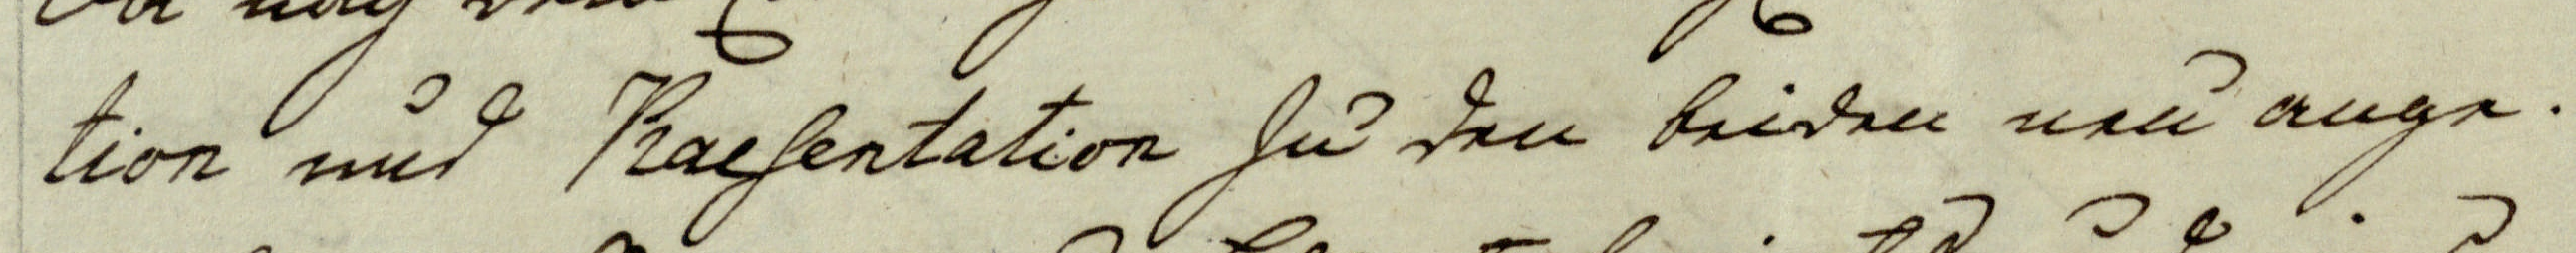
tion und Praesentation zu den beiden ange¬
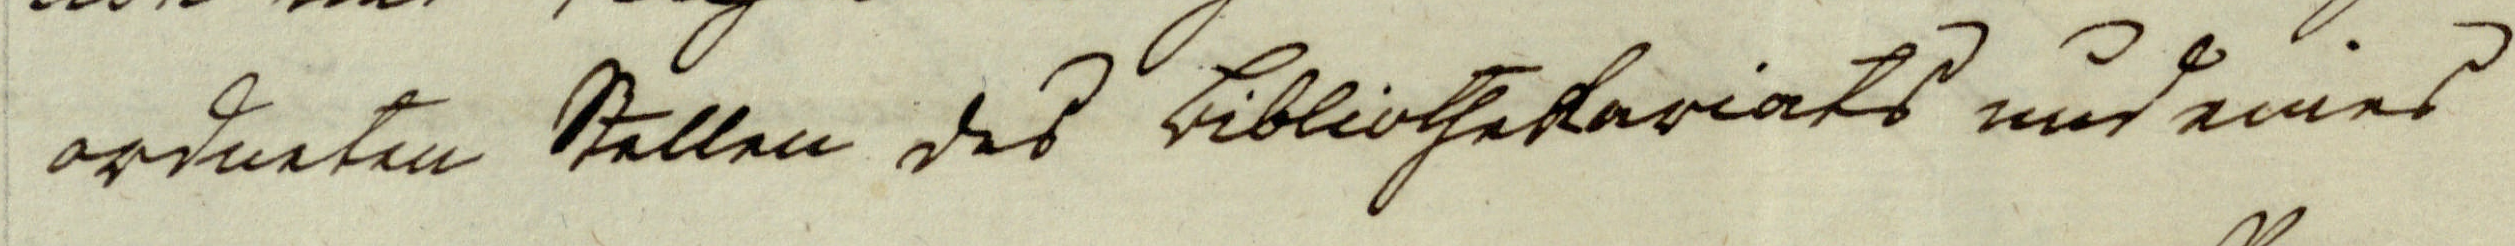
ordneten Stellen des Bibliothekariats und eines
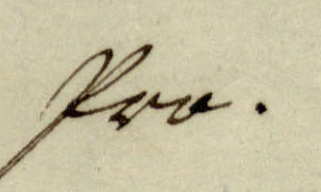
Pro¬
